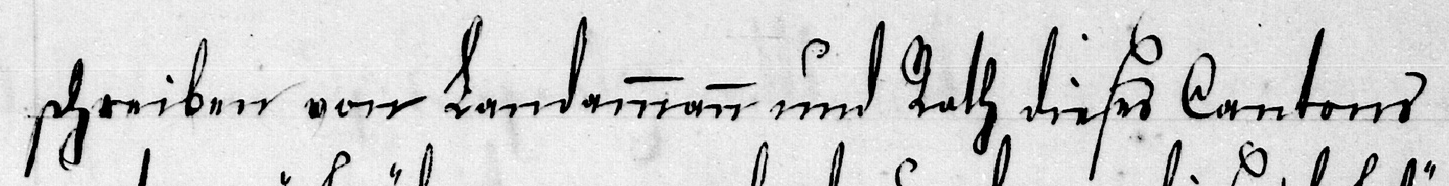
schreiben von Landammann und Rath dieses Cantons
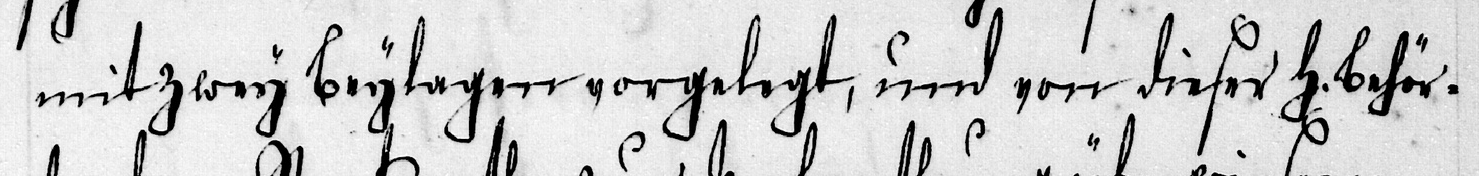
mit zwey Beylagen vorgelegt, und von dieser H. Behör¬
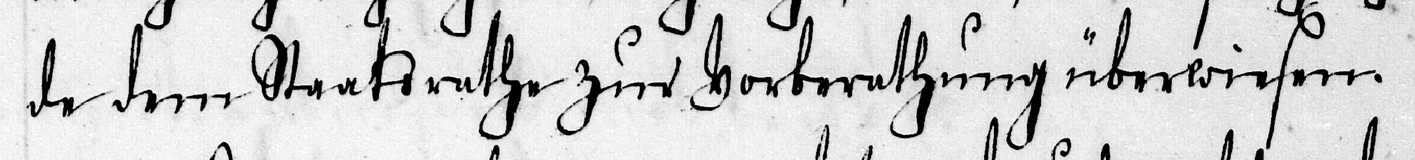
de dem Staatsrathe zur Vorberathung überwiesen.
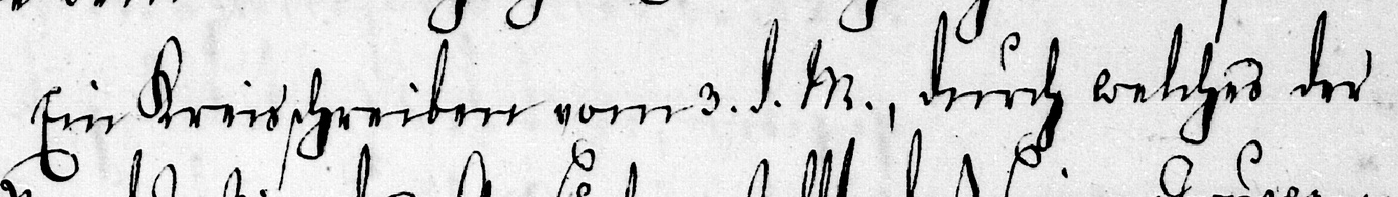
Ein Kreisschreiben vom 3. d. M., durch welches der
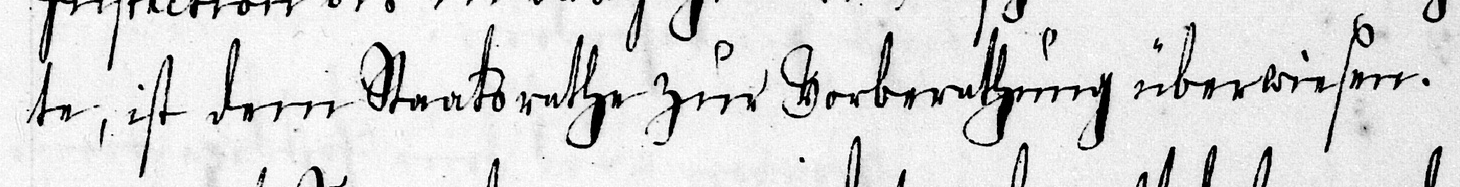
te, ist dem Staatsrathe zur Vorberathung überwiesen.
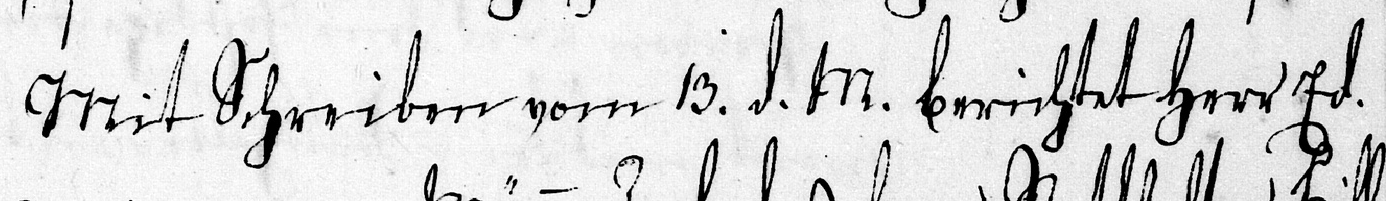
Mit Schreiben vom 13. d. M. berichtet Herr Ed.
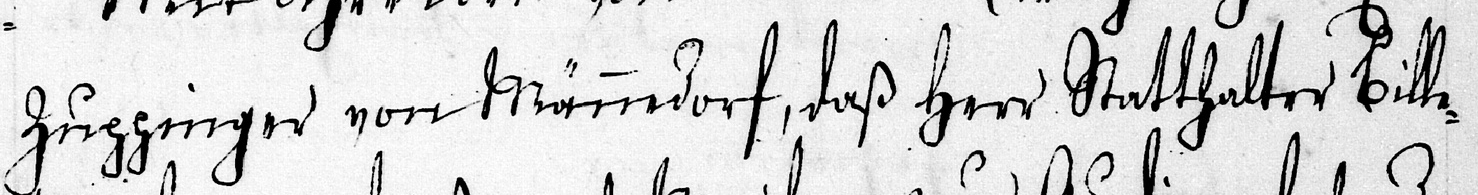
Zuppinger von Männedorf, daß Herr Statthalter Bill¬
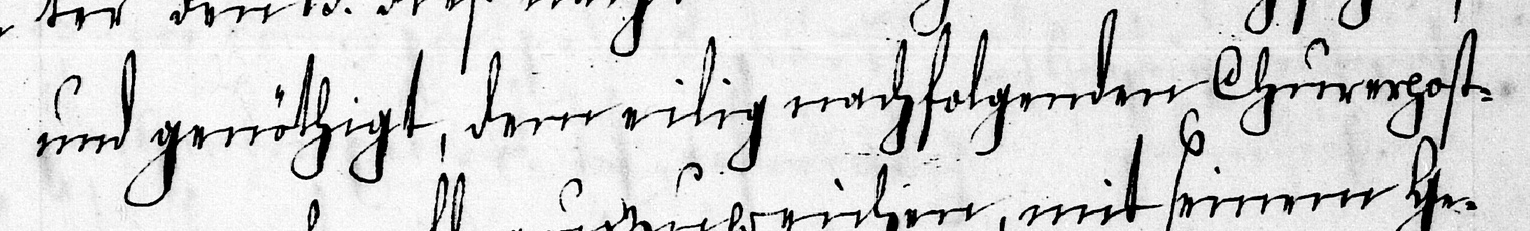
und genöthigt, dem eilig nachfolgenden Churerpost¬
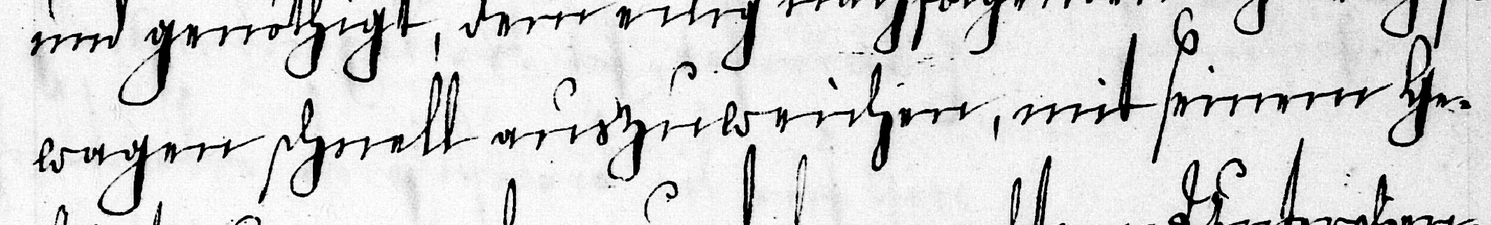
wagen schnell auszuweichen, mit seinem Ge¬
